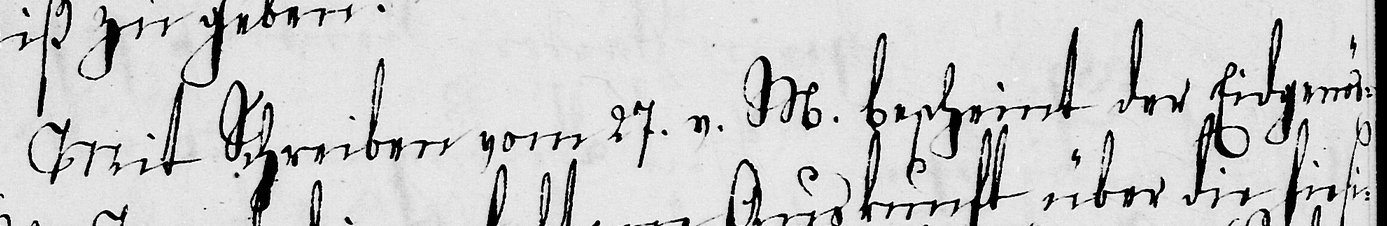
Mit Schreiben vom 27. v. M. bescheint der Eidgenö¬
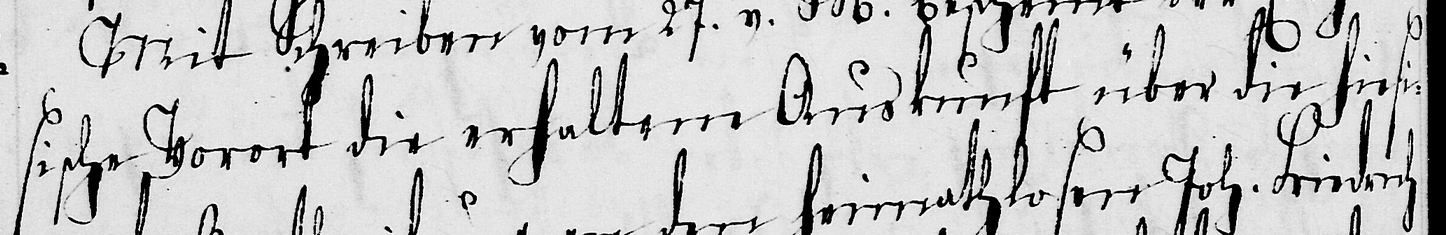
ßische Vorort die erhaltene Auskunft über die hies¬
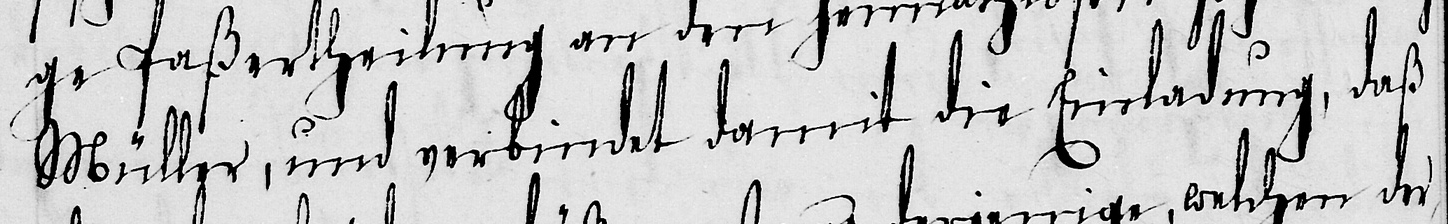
Müller, und verbindet damit die Einladung, daß
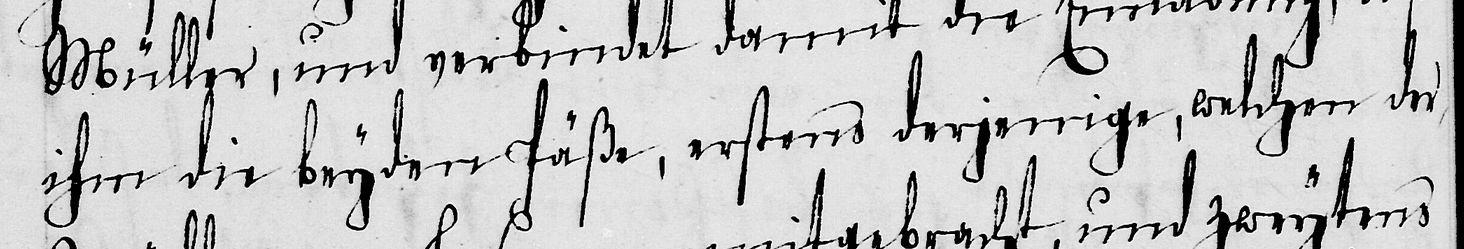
ihm die beyden Päße, erstens derjenige, welchen der
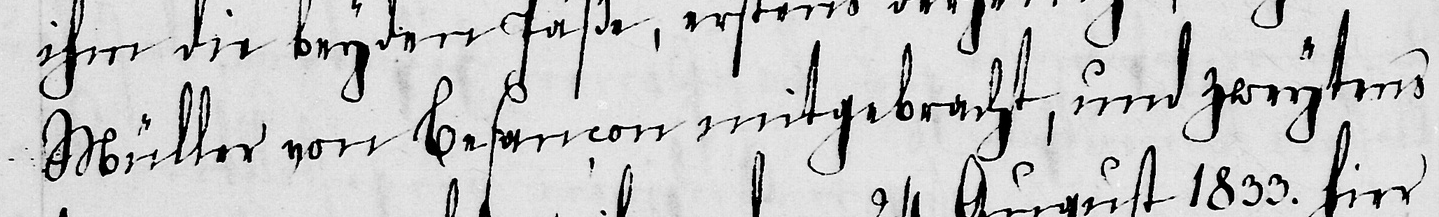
Müller von Besancon mitgebracht, und zweytens
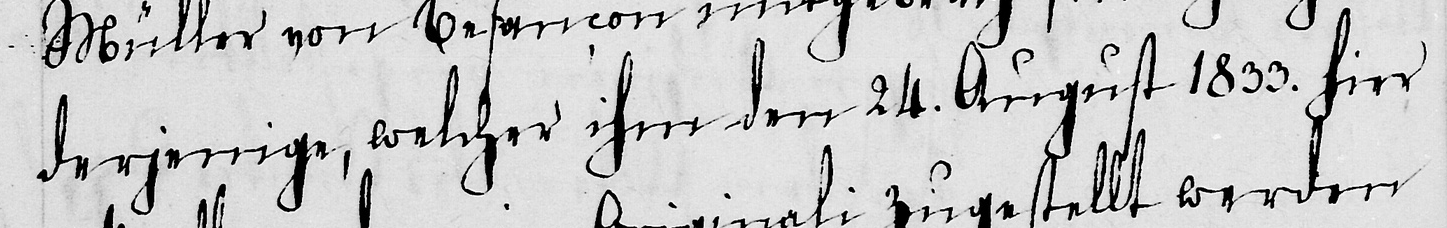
derjenige, welcher ihm den 24. August 1833. hier
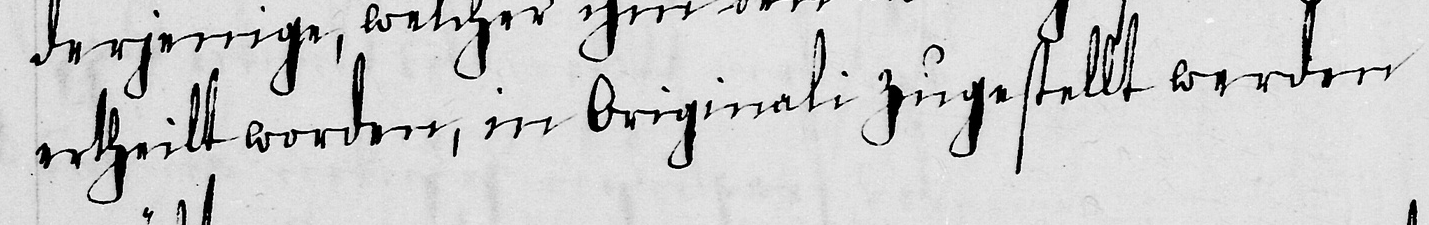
ertheilt worden, in Original zugestellt werden
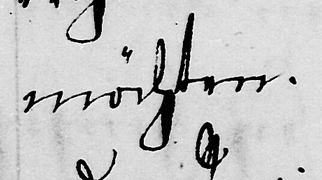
möchten.
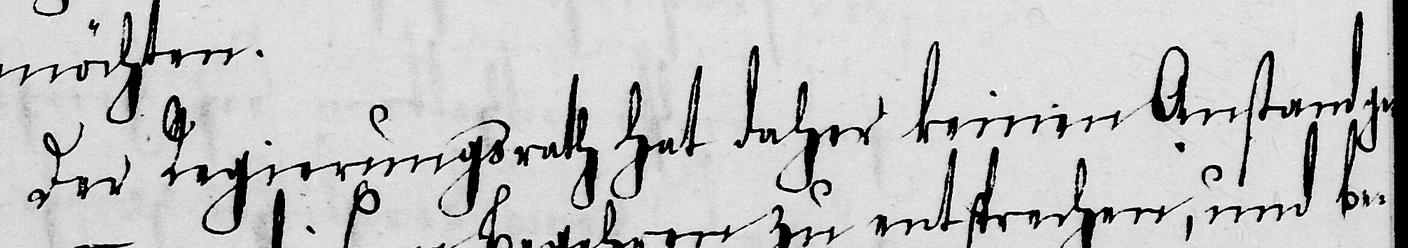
Der Regierungsrath hat daher keinen Anstand g¬
